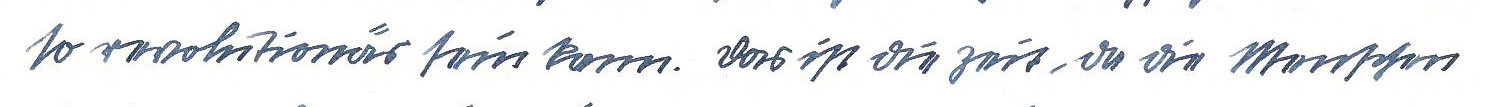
so revolutionär sein kann. Das ist die Zeit, da die Menschen
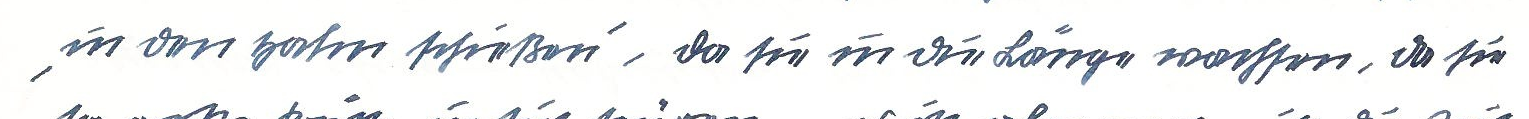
‘in den Halm schießen’, da sie in die Länge wachsen, da sie
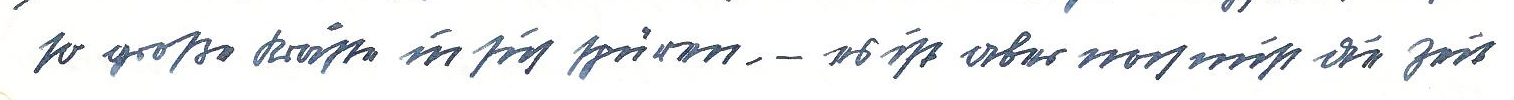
so große Kräfte in sich spüren, – es ist aber noch nicht die Zeit
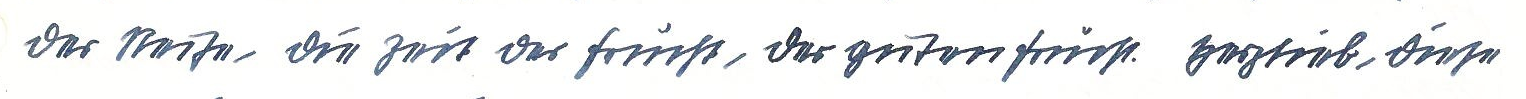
der Reife, die Zeit der Frucht, der guten Frucht. Herzlieb, diese
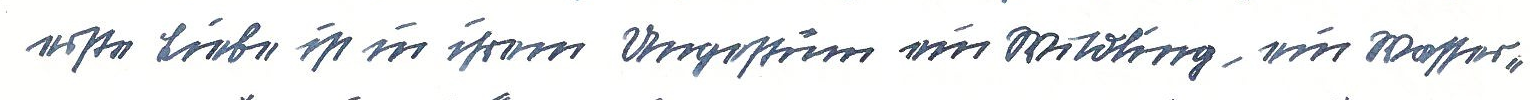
erste Liebe ist in ihrem Ungestüm ein Wildling, ein Wasser¬
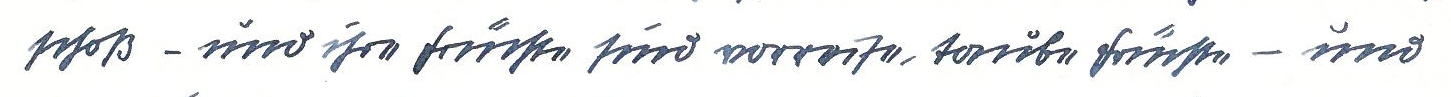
schoß – und ihre Früchte sind vorreife, taube Früchte – und
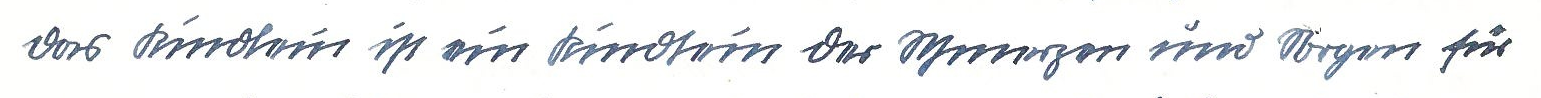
das Kindlein ist ein Kindlein der Schmerzen und Sorgen für
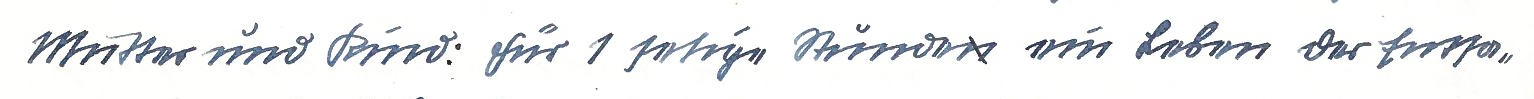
Mutter und Kind: für 1 selige Stunden ein Leben der Entsa¬
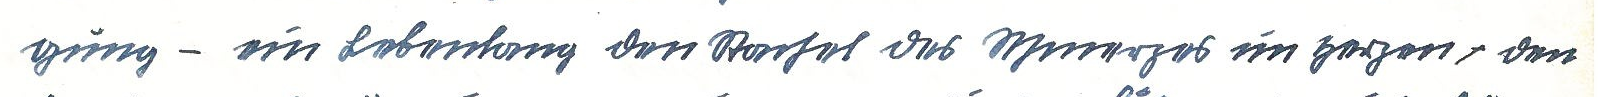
gung – ein Lebenlang den Stachel des Schmerzes im Herzen, den
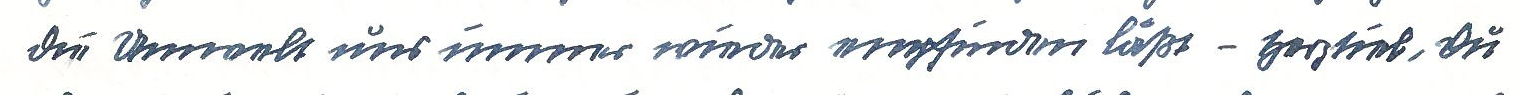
die Umwelt uns immer wieder empfinden läßt – Herzlieb, Du
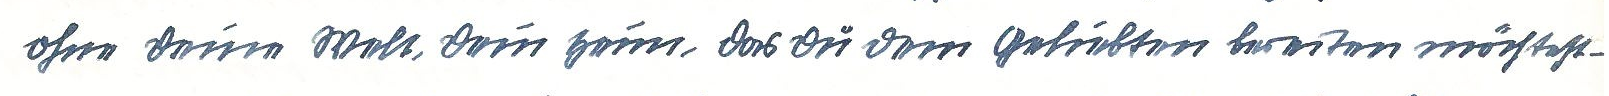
ohne Deine Welt, Dein Heim, das Du dem Geliebten bereiten möchtest –
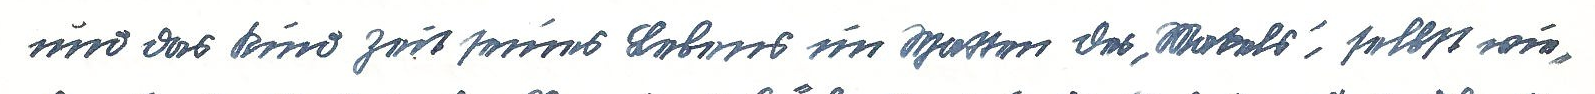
und das Kind Zeit seines Lebens im Schatten des ‘Makels’, selbst wie¬
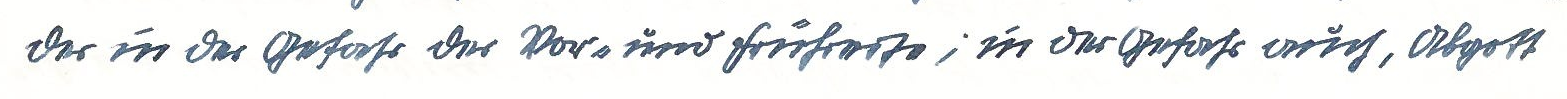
der in der Gefahr der Vor- und Frühreife; in der Gefahr auch, Abgott
